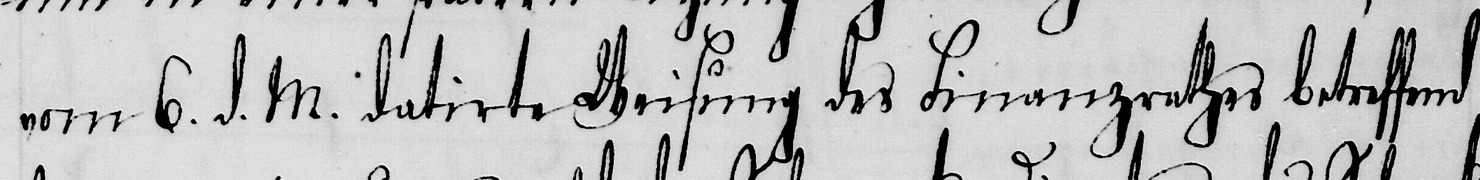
vom 6. d. M. datirte Weisung des Finanzrathes betreffe¬
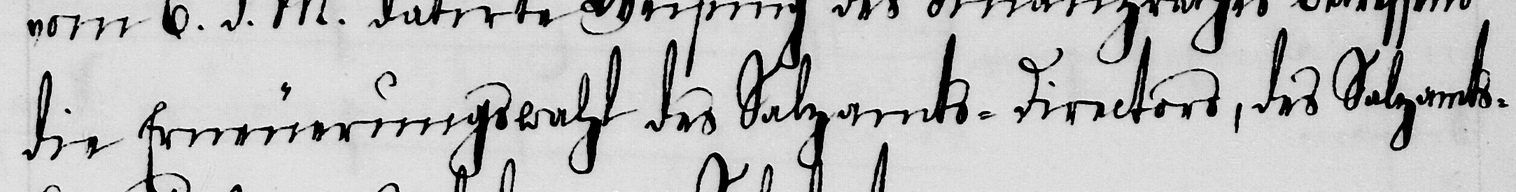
die Erneuerungswahl des Salzamts-Directors, des Salzamt¬
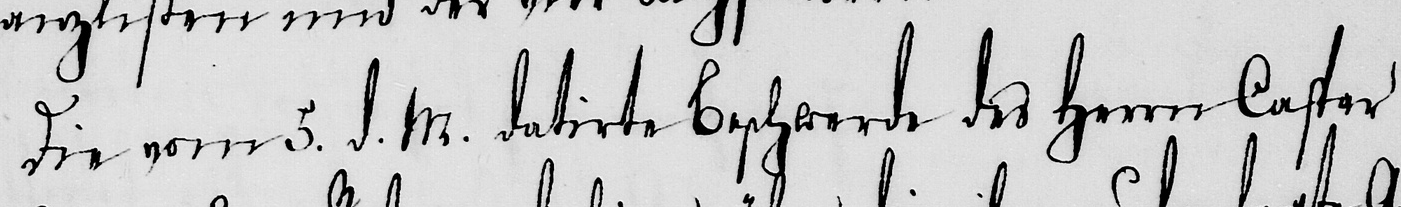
Die vom 5. d. M. datirte Beschwerde des Herrn Caspar
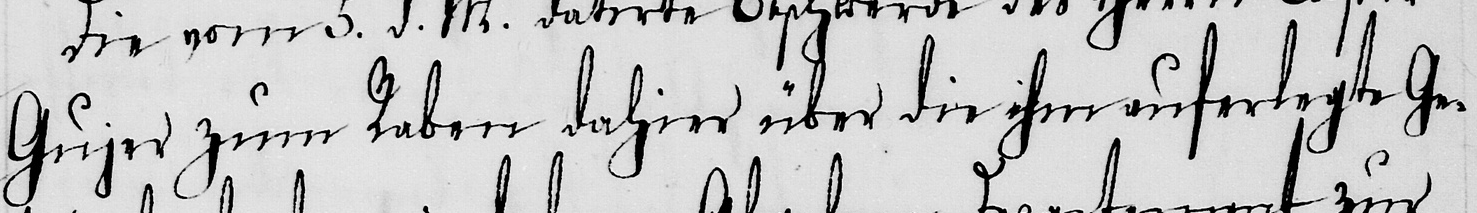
Gujer zum Raben dahier über die ihm auferlegte G¬
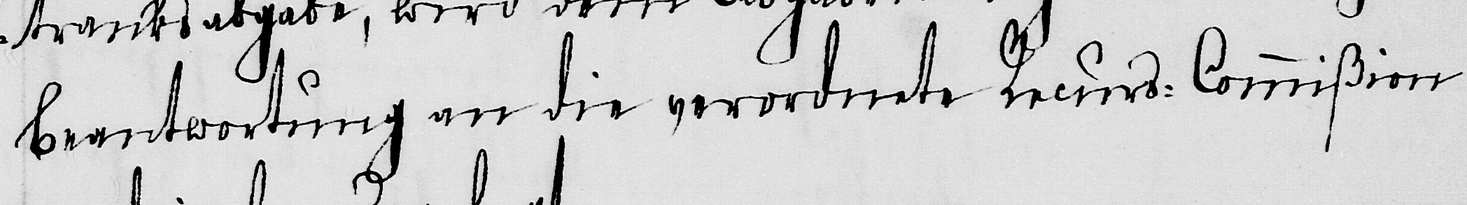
Beantwortung an die verordnete Recurs-Commißion
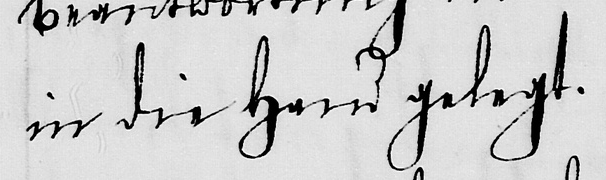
in die Hand gelegt.
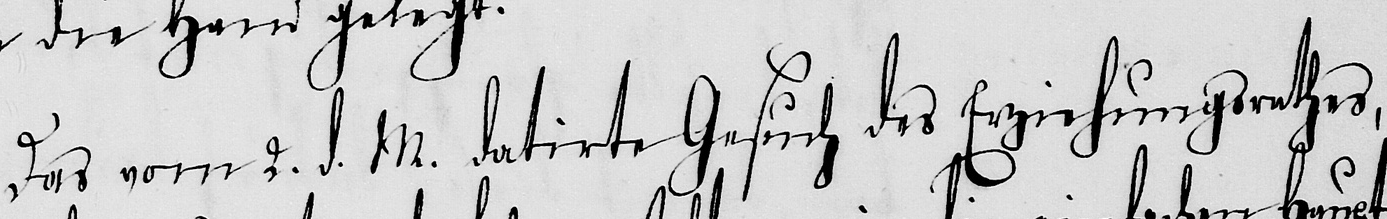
Das vom 2. d. M. datirte Gesuch des Erziehungsrathes,
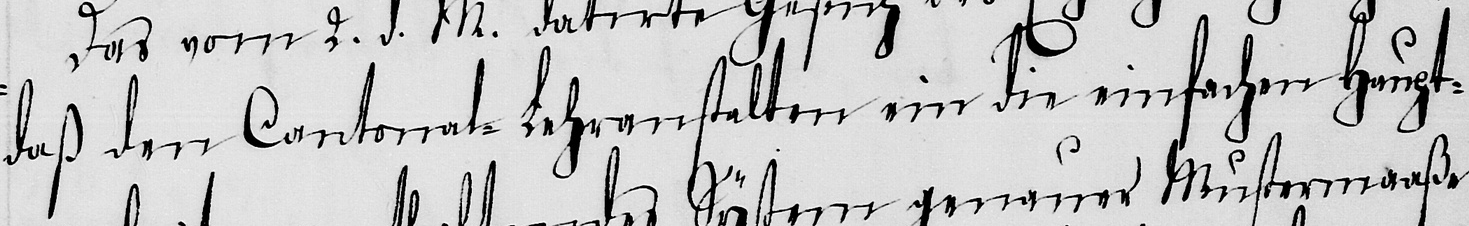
daß den Cantonal-Lehranstalten ein die einfachen Haupt¬
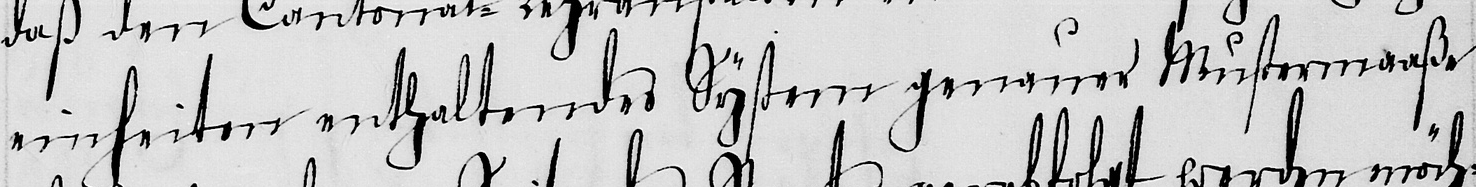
einheiten enthaltendes System genauer Mustermaaße
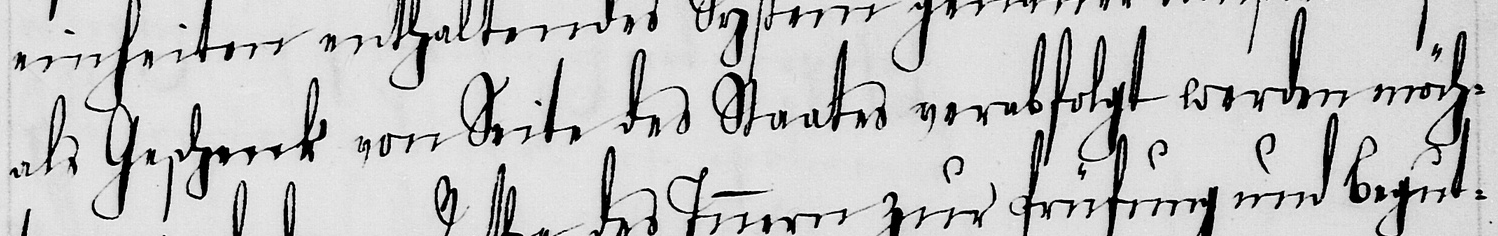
als Geschenk von Seite des Staates verabfolgt werden möch¬
